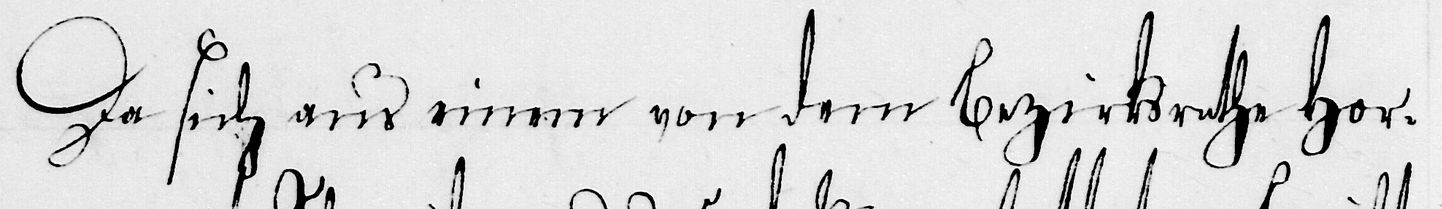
Da sich aus einem von dem Bezirksrathe Hor¬
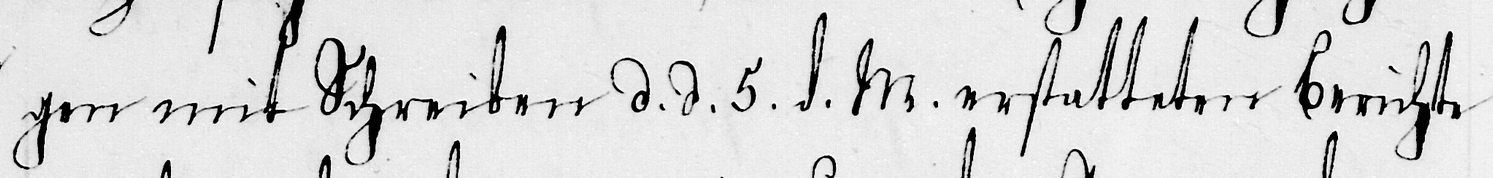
gen mit Schreiben d. d. 5. d. M. erstatteten Berichte
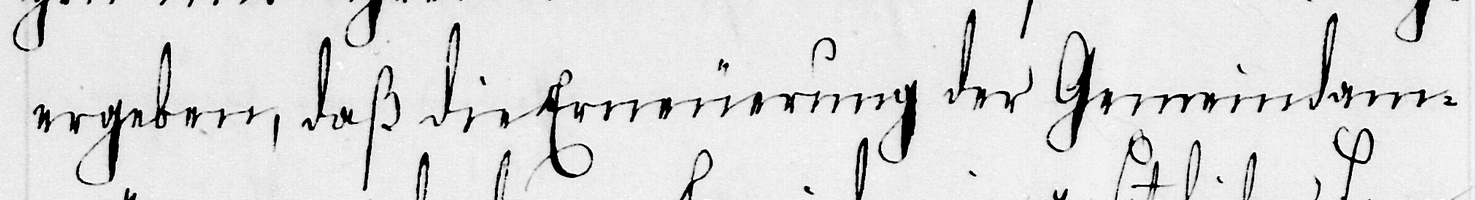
ergeben, daß die Erneuerung der Gemeindam¬
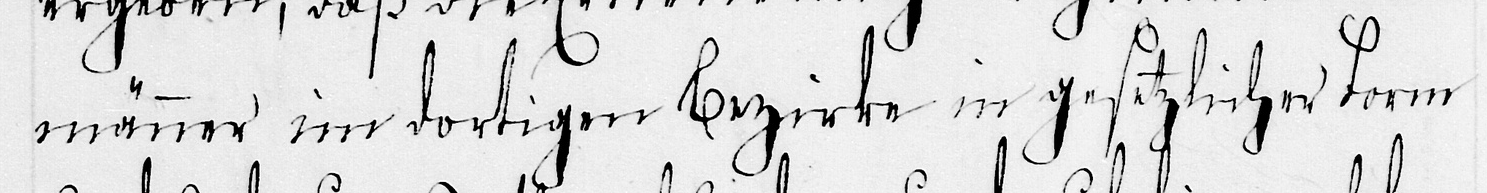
männer im dortigen Bezirke in gesetzlicher Form
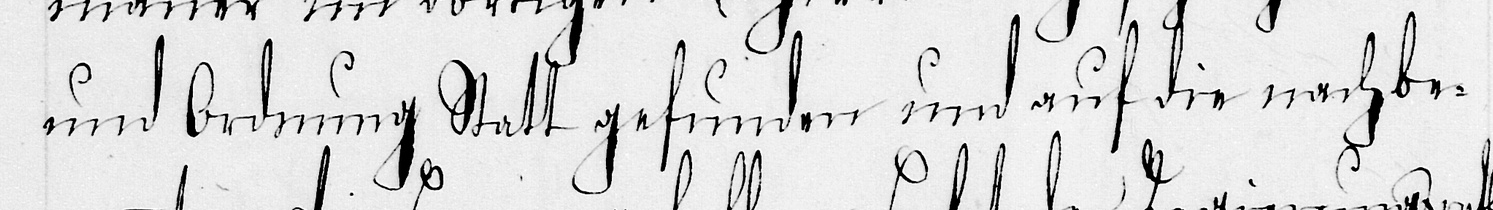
und Ordnung Statt gefunden und auf die nachbe¬
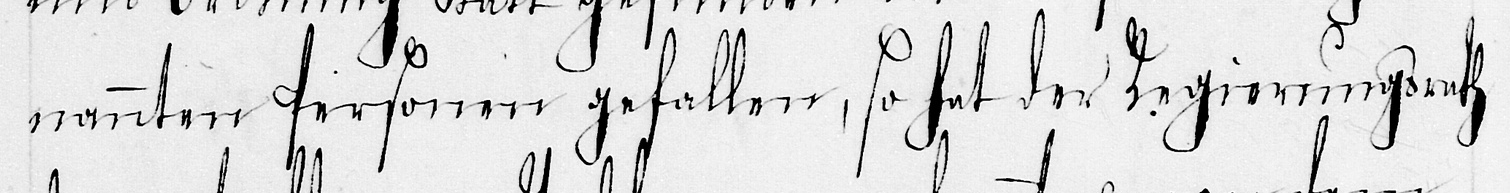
nannten Personen gefallen, so hat der Regierungsrath
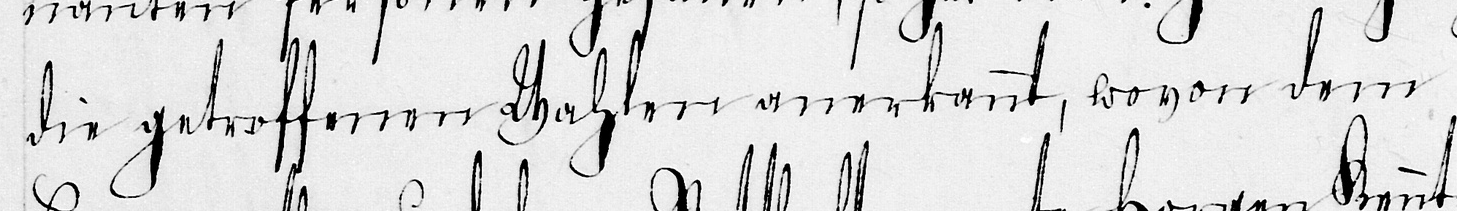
die getroffenen Wahlen anerkannt, wovon dem
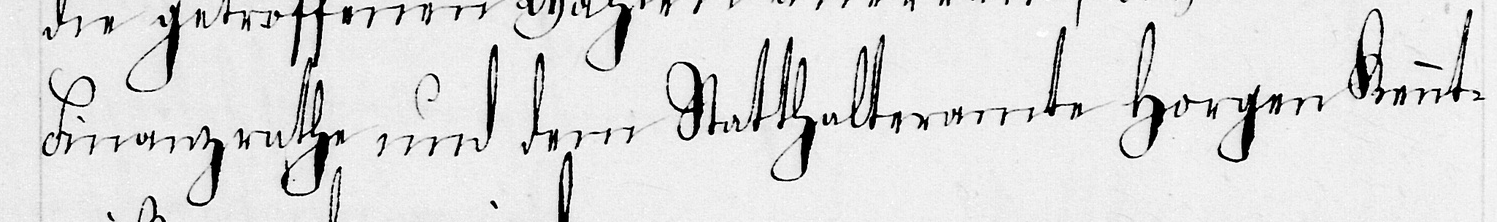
Finanzrathe und dem Statthalteramte Horgen Kennt¬
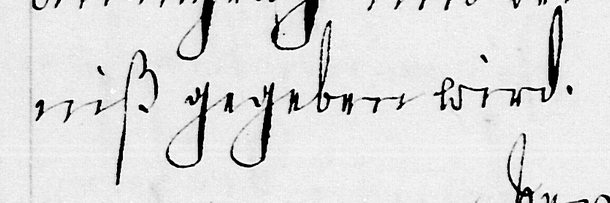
niß gegeben wird.
